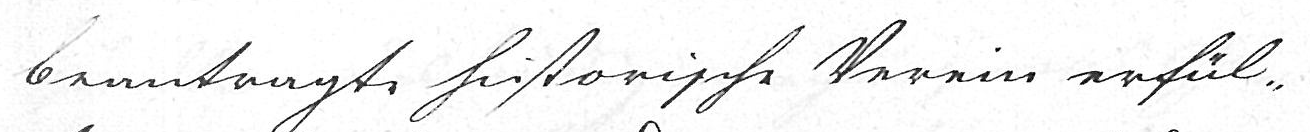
beantragte historische Verein erfül-
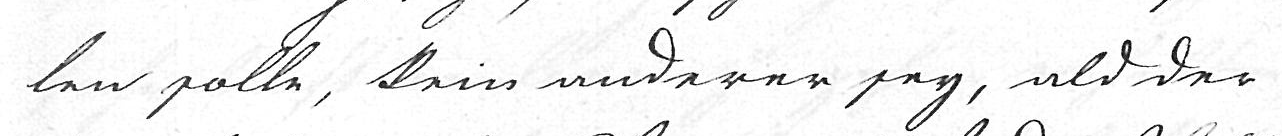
len solle, kein anderer sey, als der
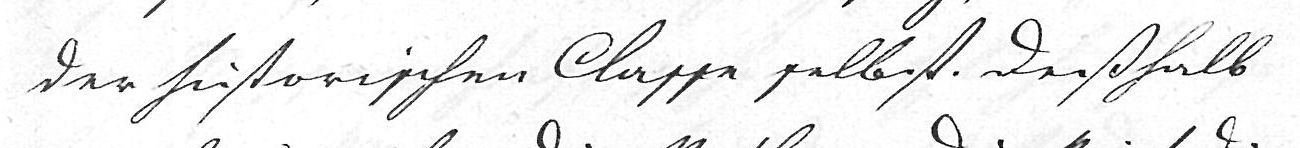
der historischen Classe selbst. Deßhalb
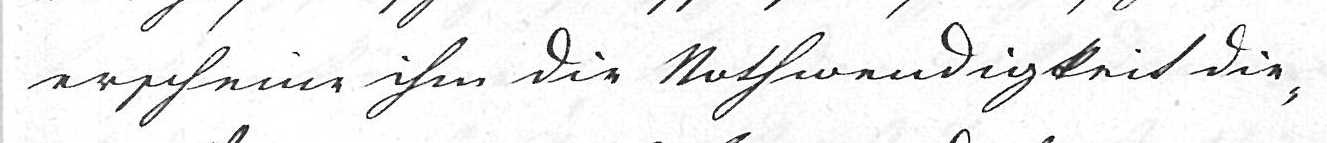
erscheine ihm die Nothwendigkeit die-
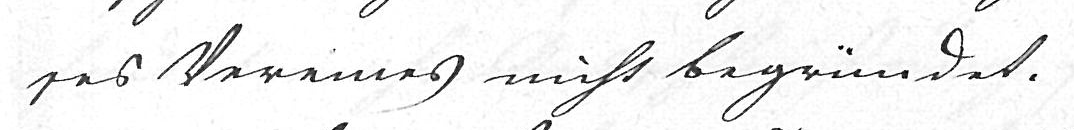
ses Vereines nicht begründet.
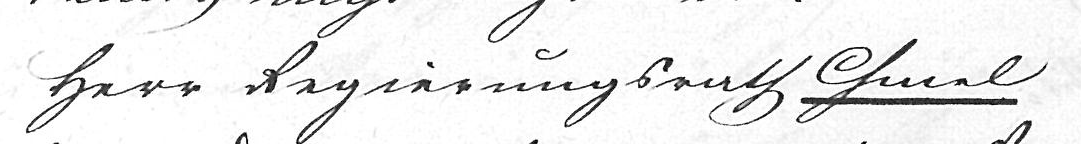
Herr Regierungsrath Chmel
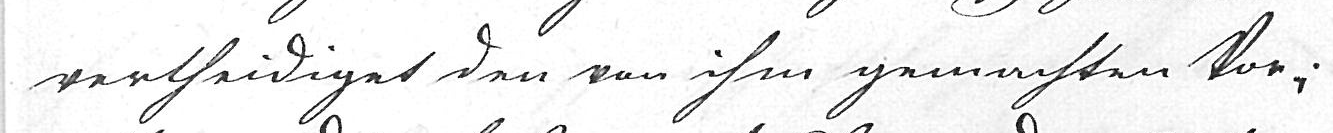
vertheidiget den von ihm gemachten Vor-
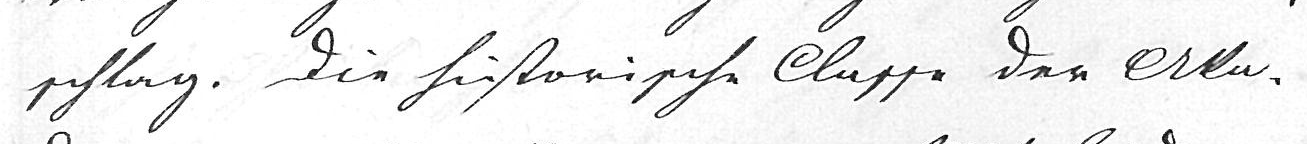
schlag. Die historische Classe der Aka-
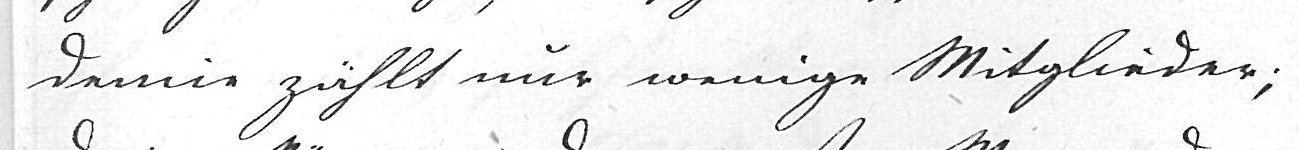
demie zählt nur wenigen Mitglieder;
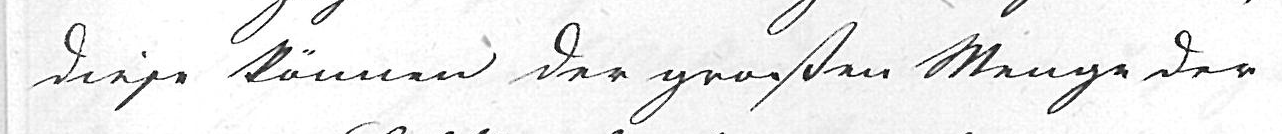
diese können der großen Menge der
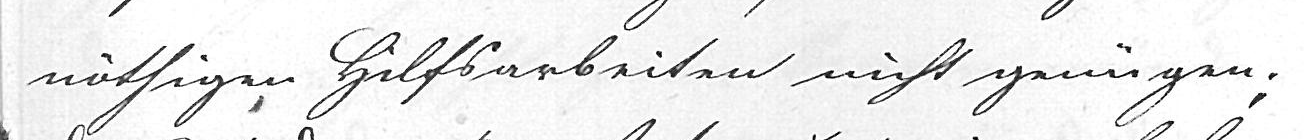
nöthigen Hilfsarbeiten nicht genügen;
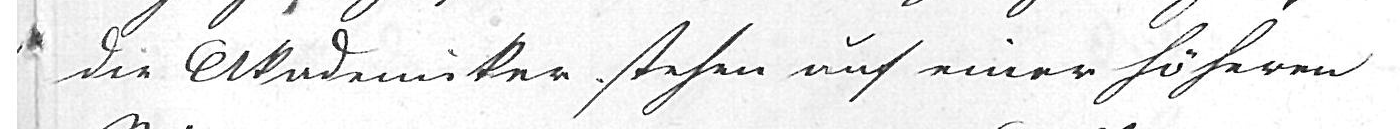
die Akademiker stehen auf einer höheren
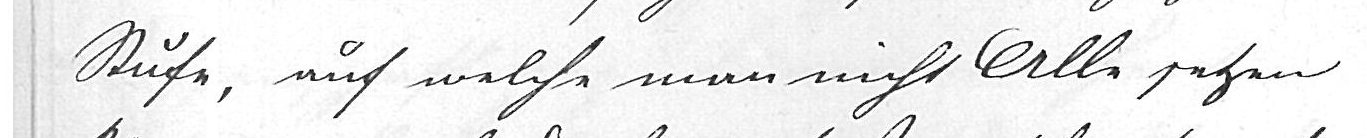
Stufe, auf welche man Alle setzen
